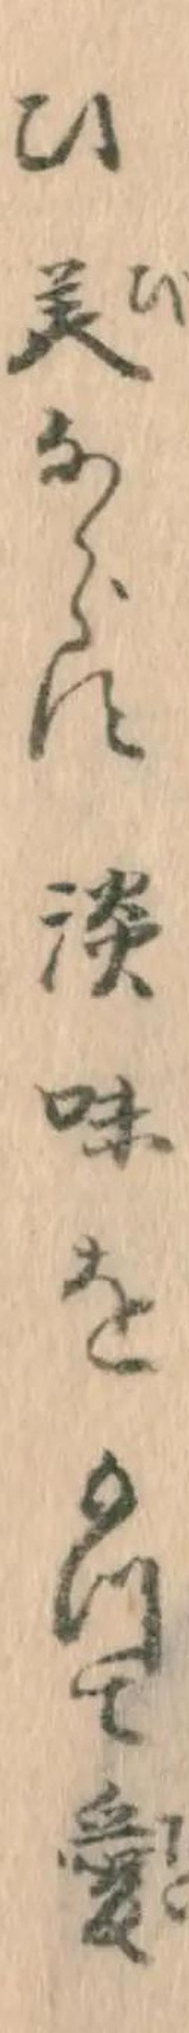ひ美ならす淡味をもつて愛
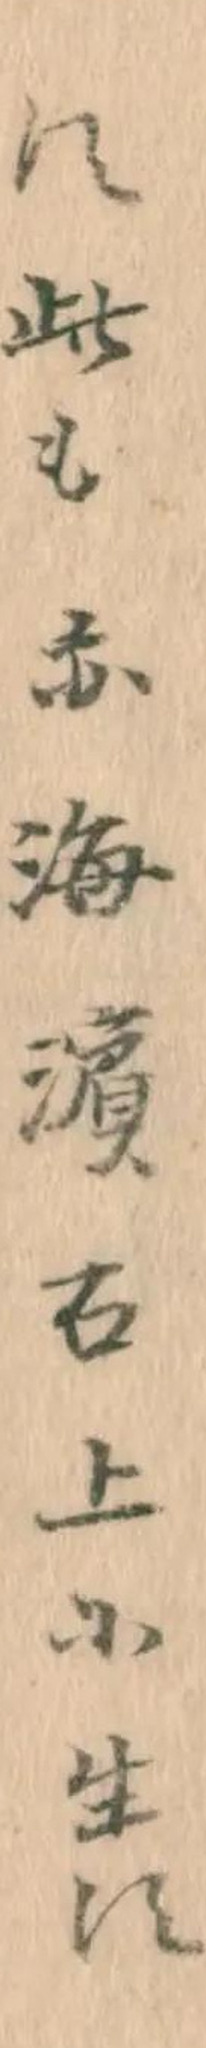す此も亦海浜石上に生す
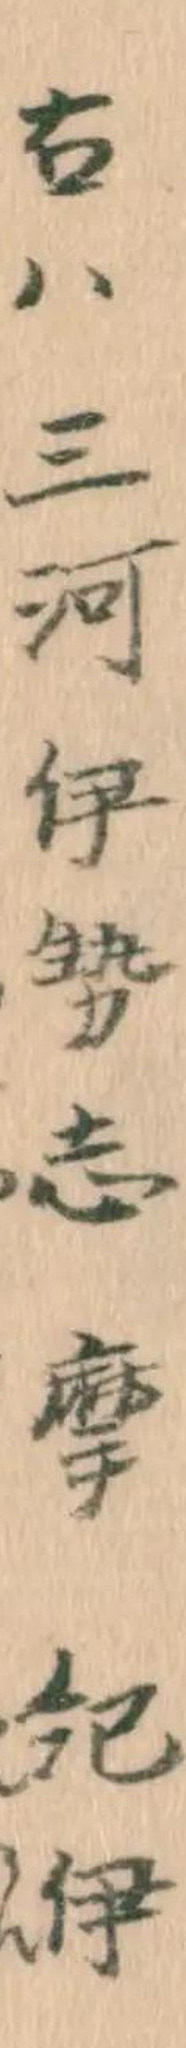古は三河伊勢志摩紀伊
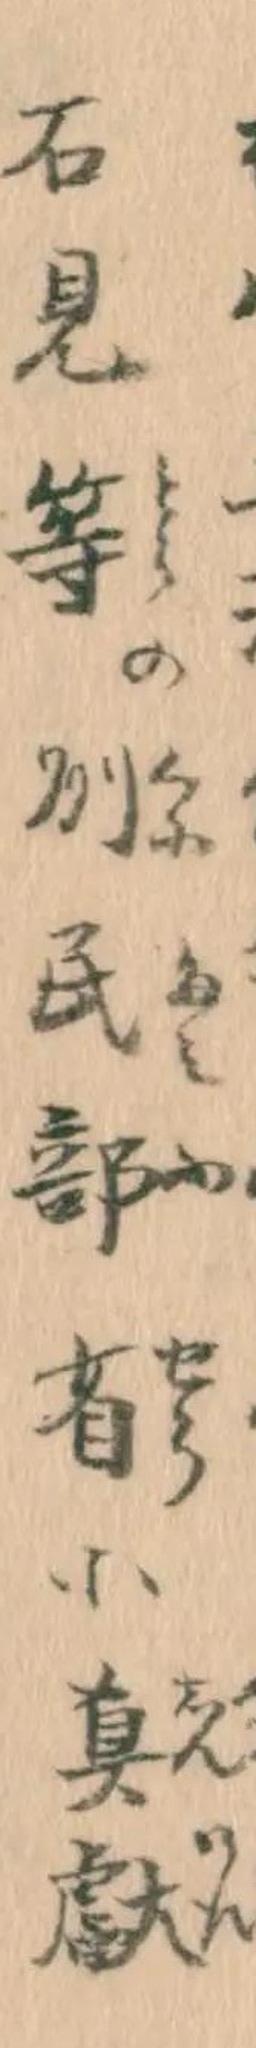石見等の州民部省に真献
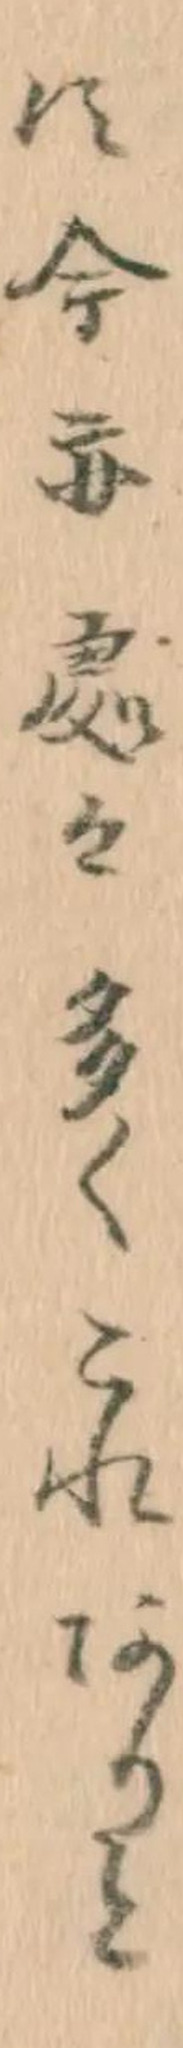す今亦処々多くこれありと
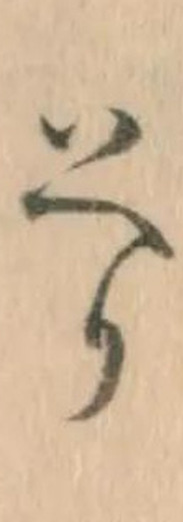いへり
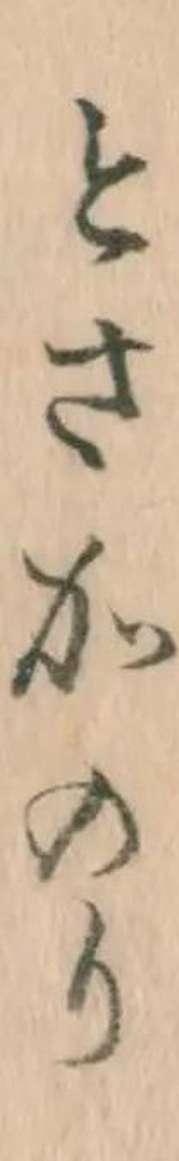とさかのり
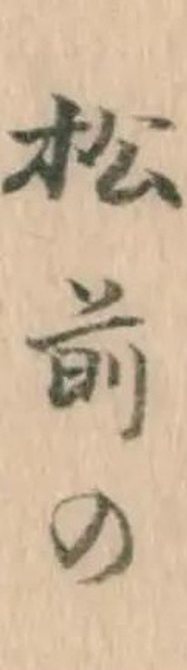松前の

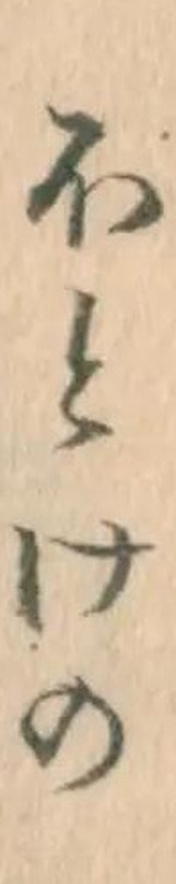ほとけの
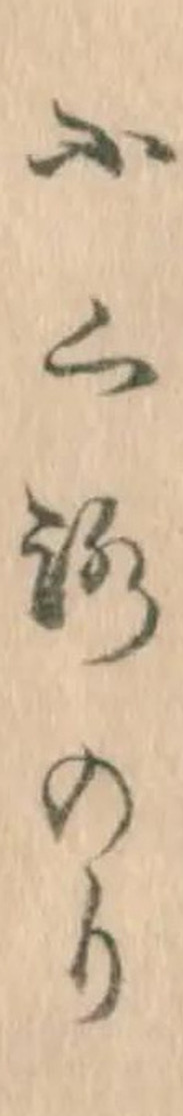ふくろのり
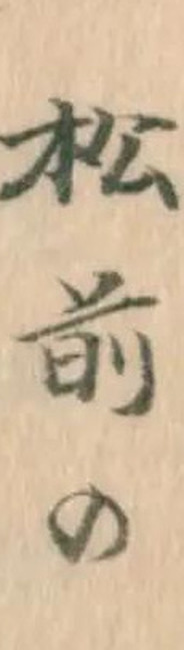松前の
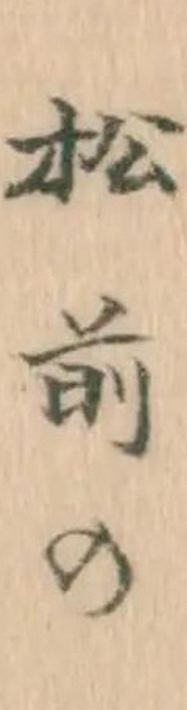松前の

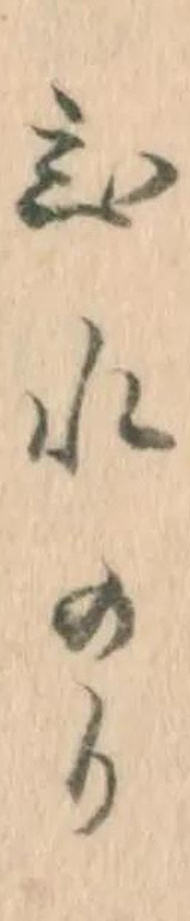ひれのり
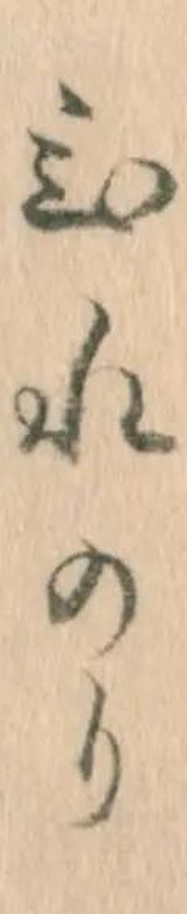ひれのり
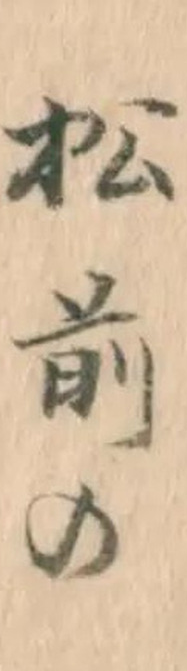松前の
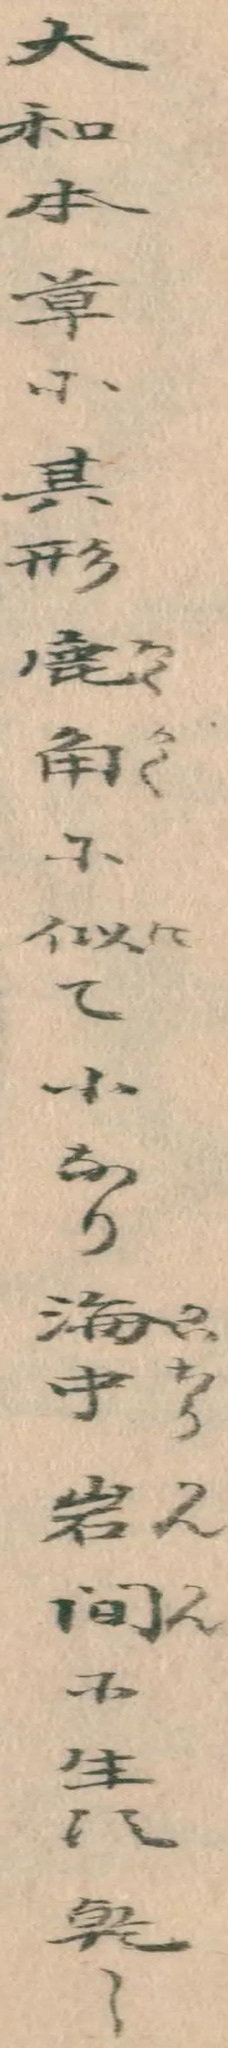大和本草に其形鹿角に似て小なり海中岩間に生す乾し
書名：本草図譜. 巻52-54
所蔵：国立国会図書館 National Diet Library, JAPAN
